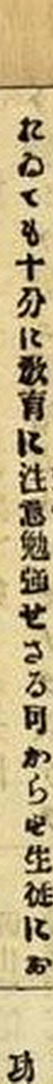おゐても十分に教育に注意勉強せさる可からす生徒にお
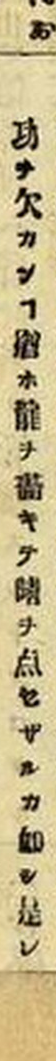功ヲ欠カンヿ猶ホ龍ヲ画キテ睛ヲ点セザルガ如シ是レ
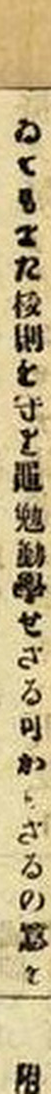ゐてもまた校則を守り黽勉勧学せざる可からざるの意を
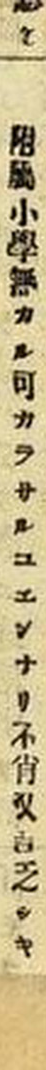附属小学無カル可カラサルユエンナリ不肖又吉乏シキ
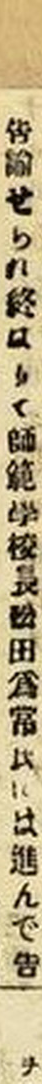告諭せられ終はりて師範学校長松田為常氏には進んで告
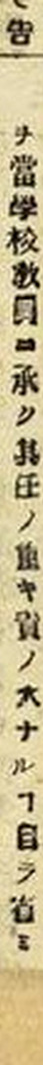ヲ当学校教員ニ承ク其任ノ重キ責ノ大ナルヿ自ラ省ミ
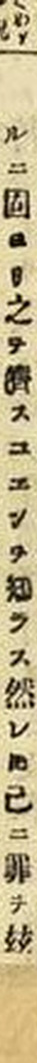ルニ固ヨリ之ヲスユエンヲ知ラス然レトモ已ニヲ茲
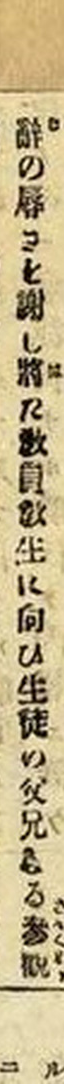辞の辱きを謝し将た教員教生に向ひ生徒の父兄為る参観
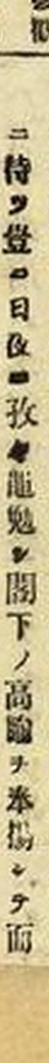ニ待ツ豈ニ日夜ニ孜々黽勉シ閣下ノ高諭ヲ挙揚シテ而
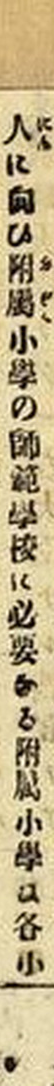人に向ひ附属小学の師範学校に必要なる附属小学は各小
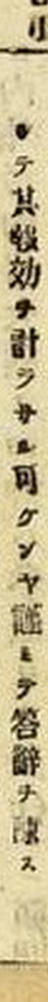シテ其効ヲ計ラサル可ケンヤ謹ミテ答辞ヲ陳ス
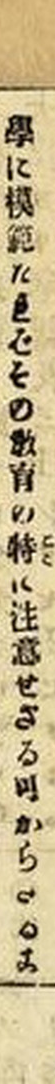学に模範たればその教育の特に注意せざる可からざるこ
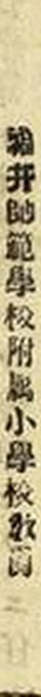福井師範学校附属小学校教員
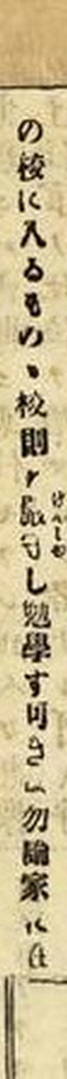の校に入るものゝ校則を厳守し勉学す可きは勿論家に在
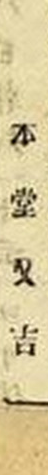本堂又吉
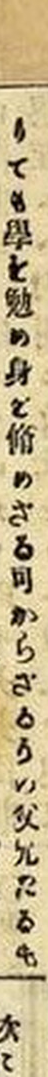りても学を勉め身を脩めざる可からざるその父兄たるも
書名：温古集 五巻
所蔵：福井県文書館 Fukui Prefectural Archives
